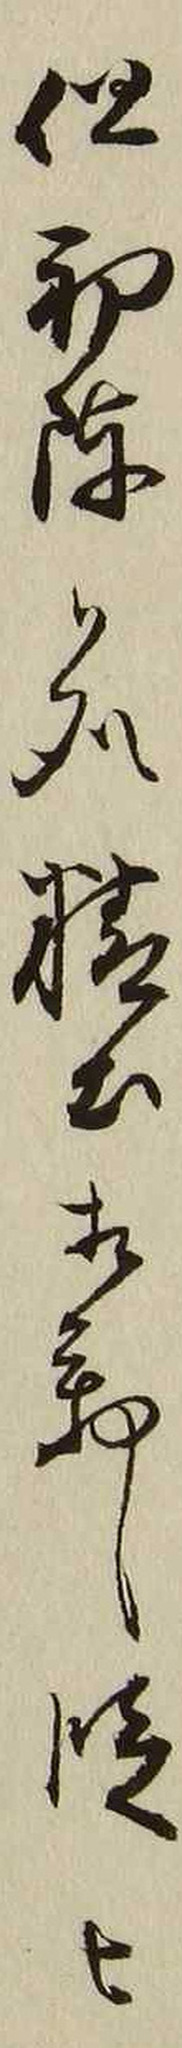但初陣候処精出相勤候段被
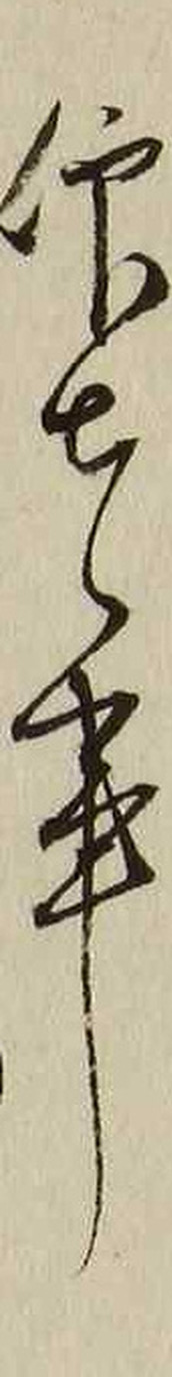仰出候事
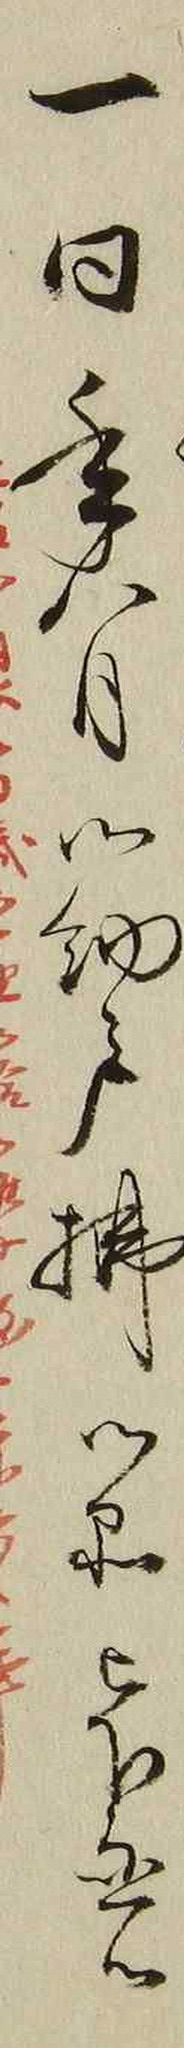一同年八月御納戸払御品被下置候
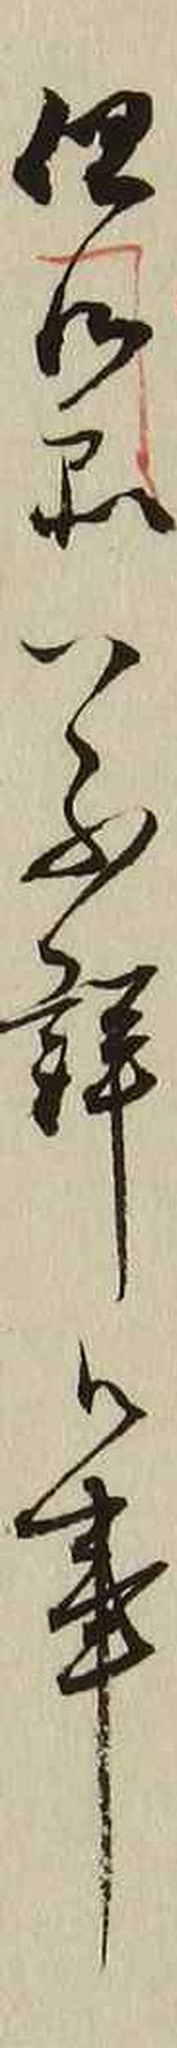但御品ハ不詳候事
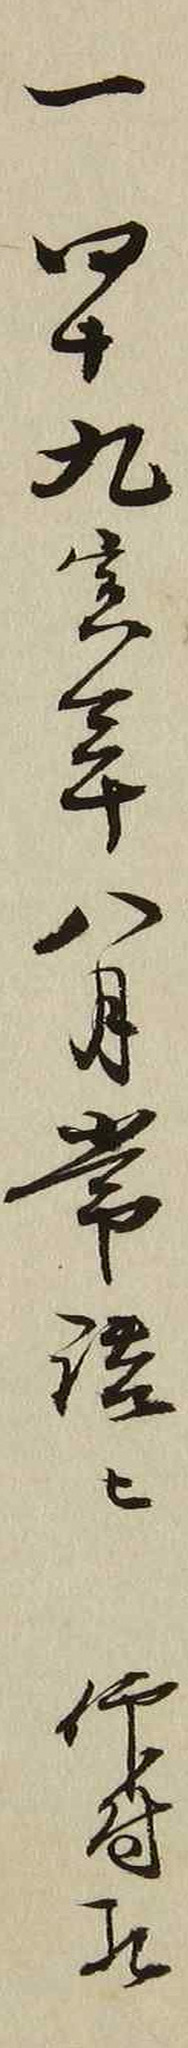一々十九寅年八月常詰被仰付罷
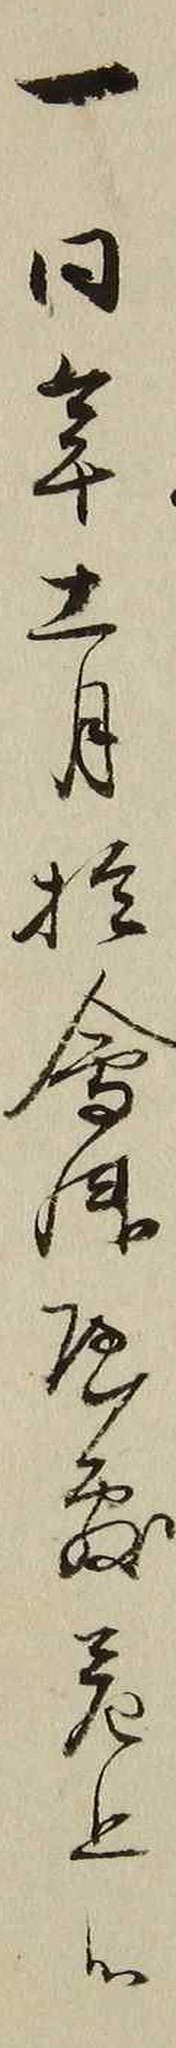一同年十一月於会津屋敷差上候
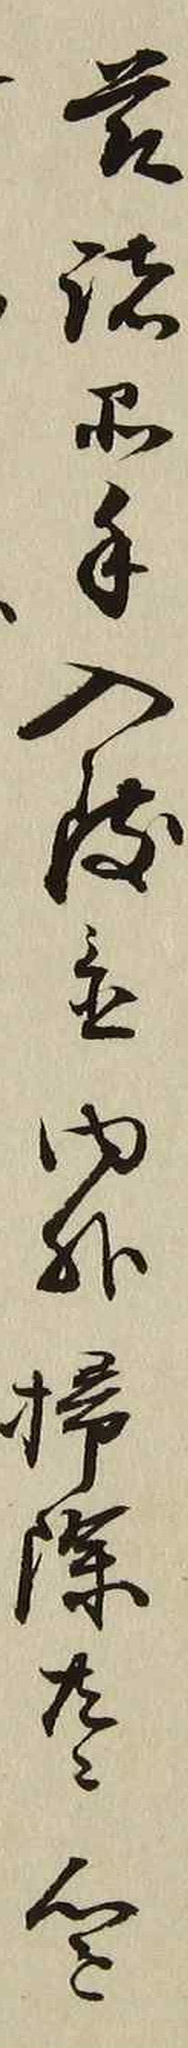節諸品手入致置内外掃除共に心を
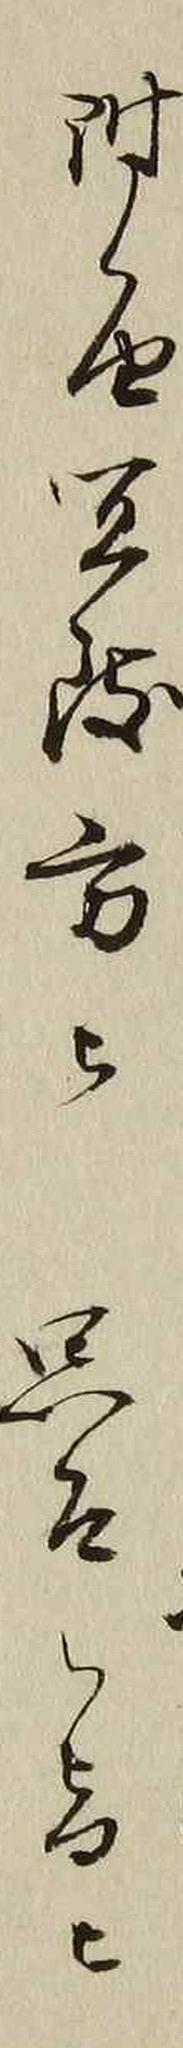附候由宜致方被思召候旨
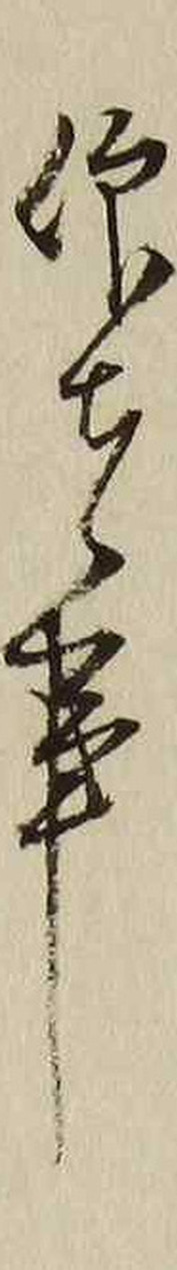仰出候事
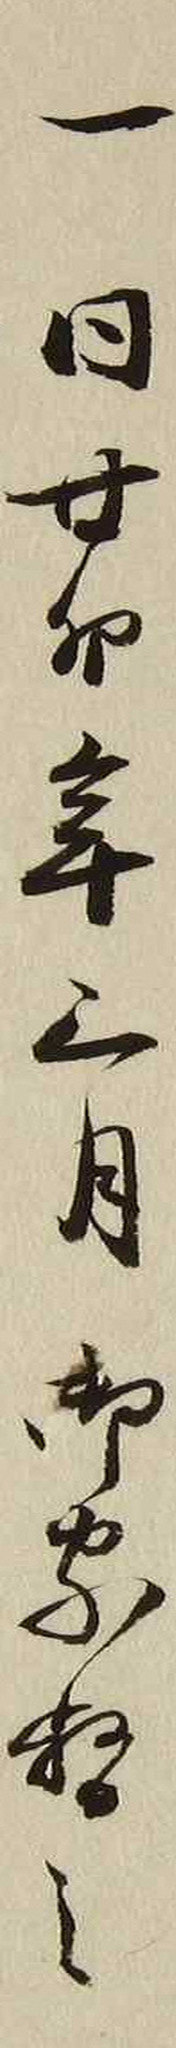一同二十卯年三月御家督之
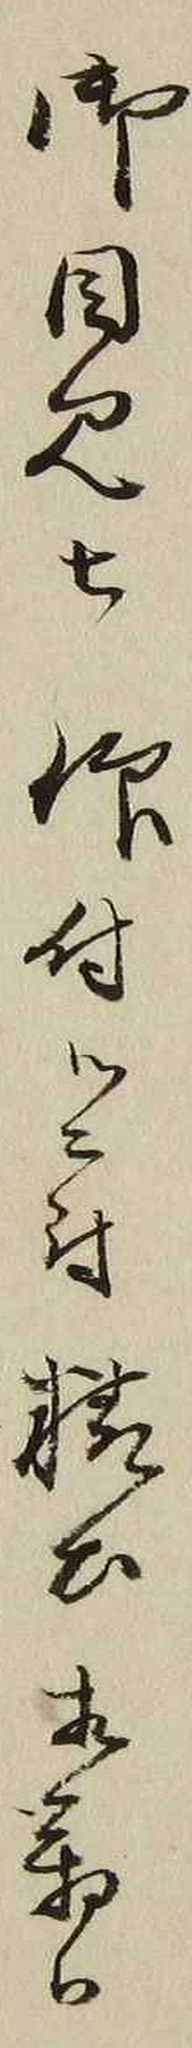御目見被仰付候に付精出相勤候
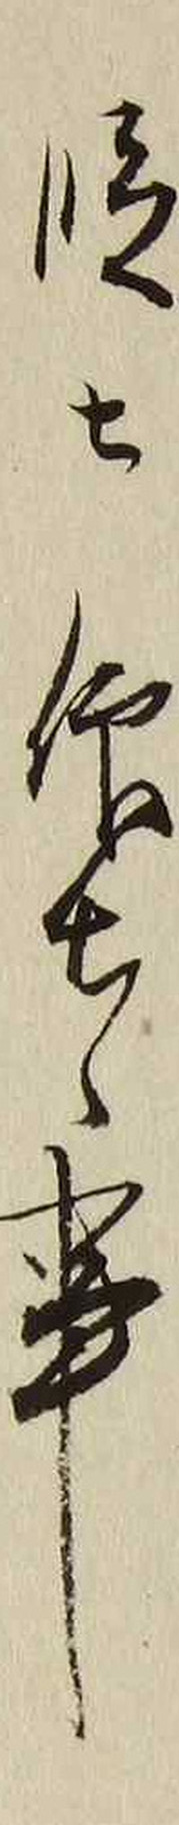段被仰出候事
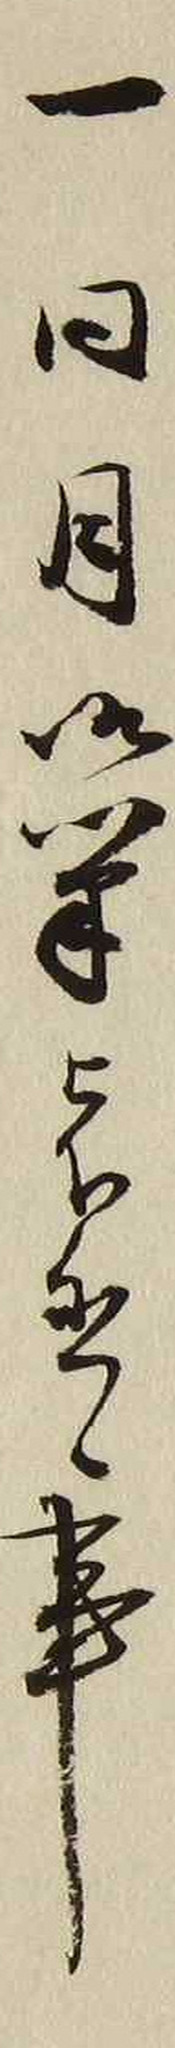一同月御筆被下置候事
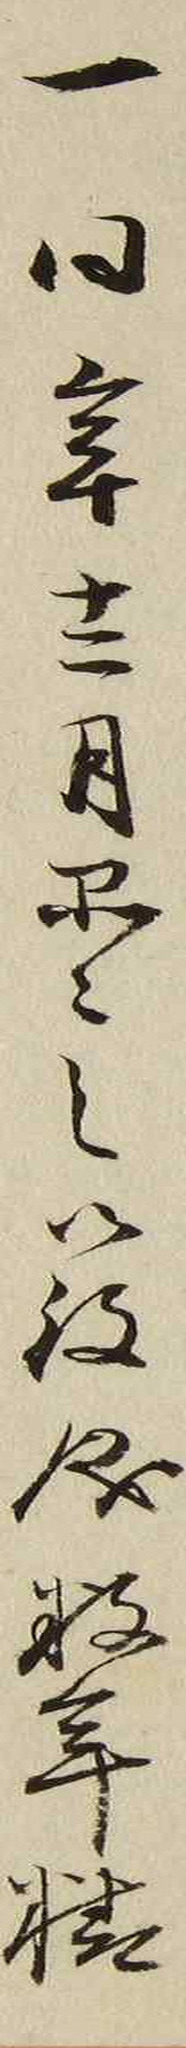一同年十二月品々之御役儀枚年精
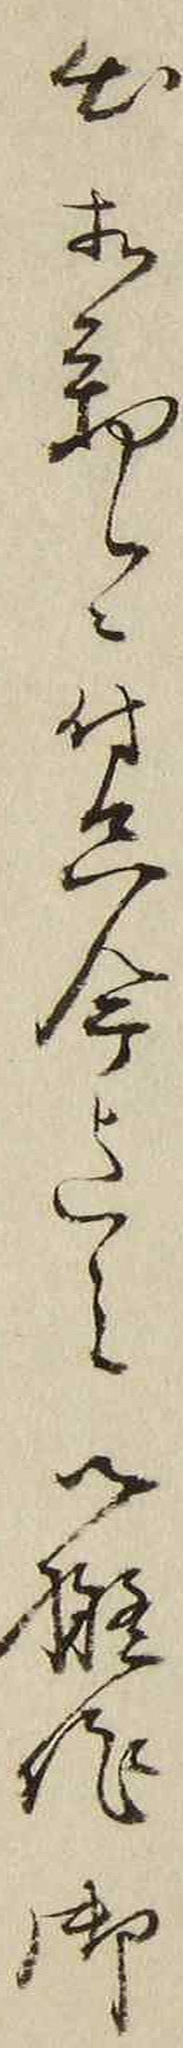出相勤候に付只今迄之御擬作御
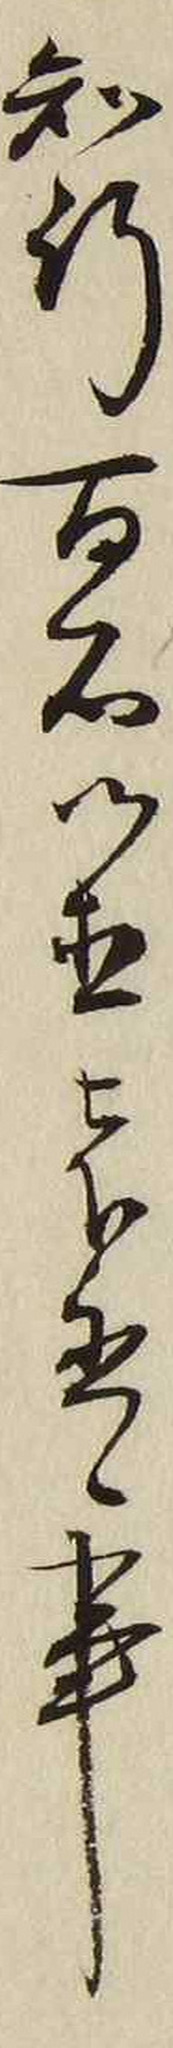知行百石御直被下置候事
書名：諸士系譜　巻之292　き之部1
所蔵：会津若松市立会津図書館
